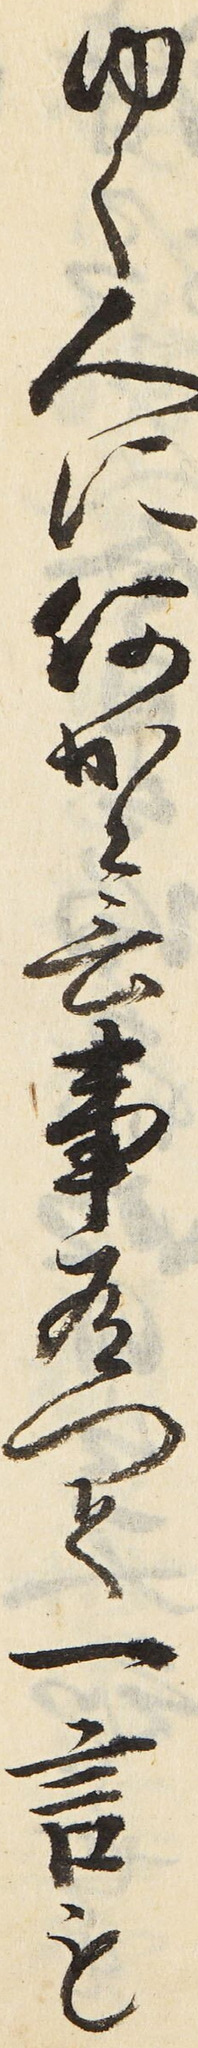ゆく人に何かと云事有つて一言も
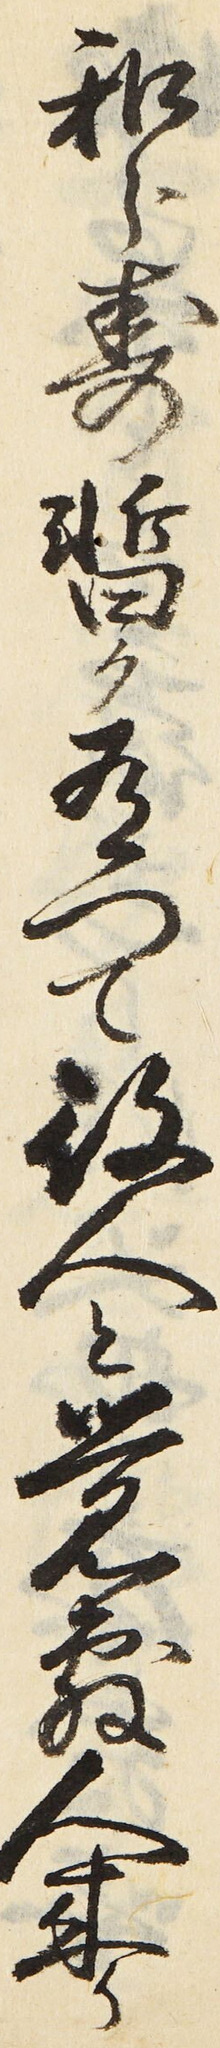知らす暫く有つて役人と覚敷人来り
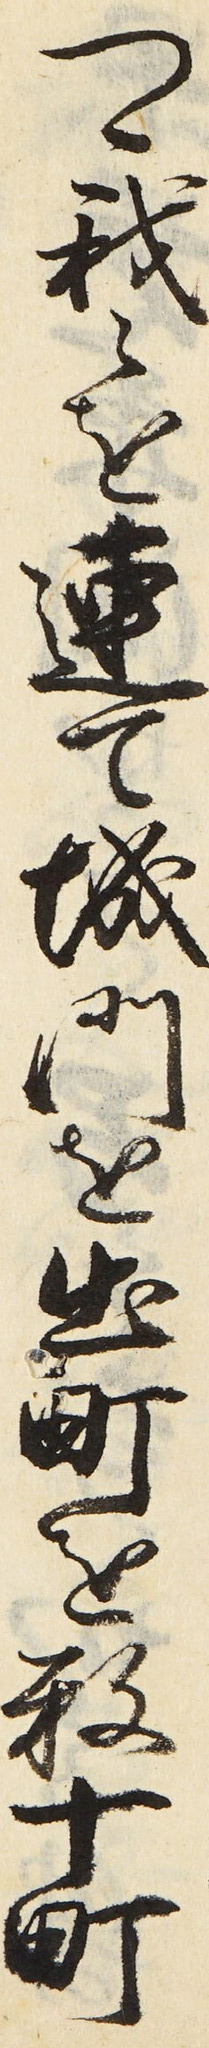つゝ我々を連て城門を出町を数十町
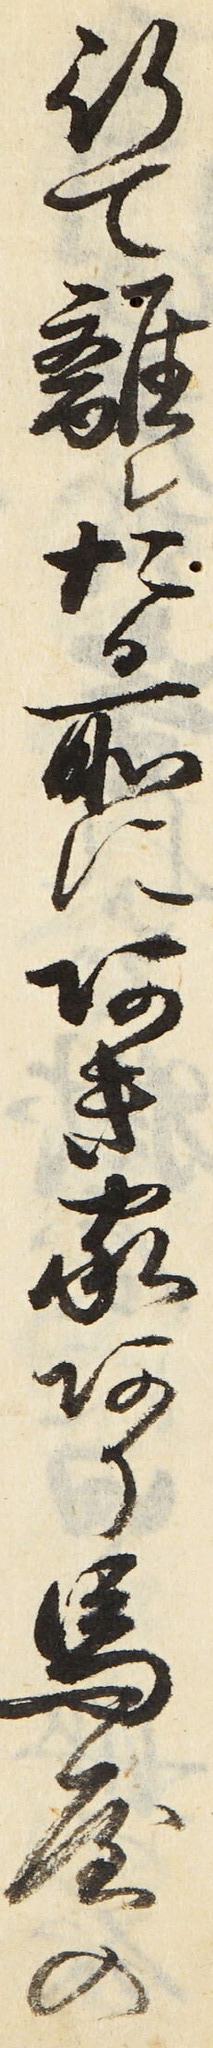行て離れたる所にあき家あり馬屋の
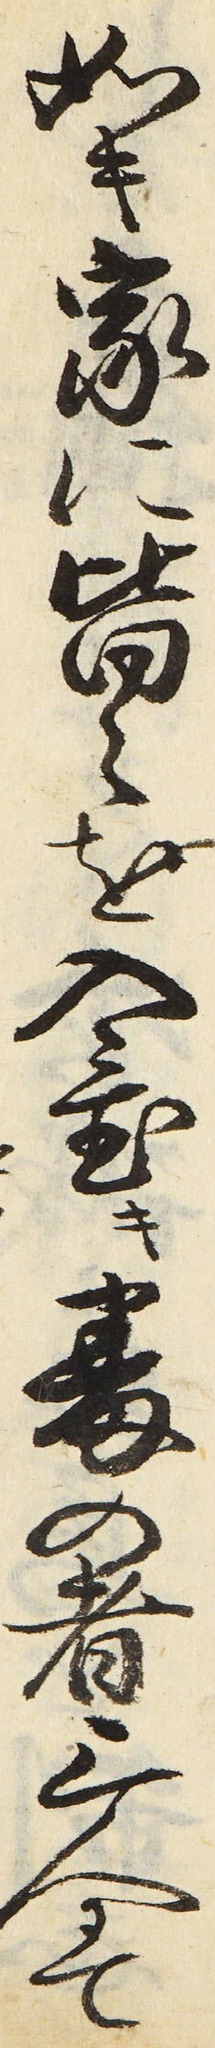如き家に皆々を入置き番の者三人にて
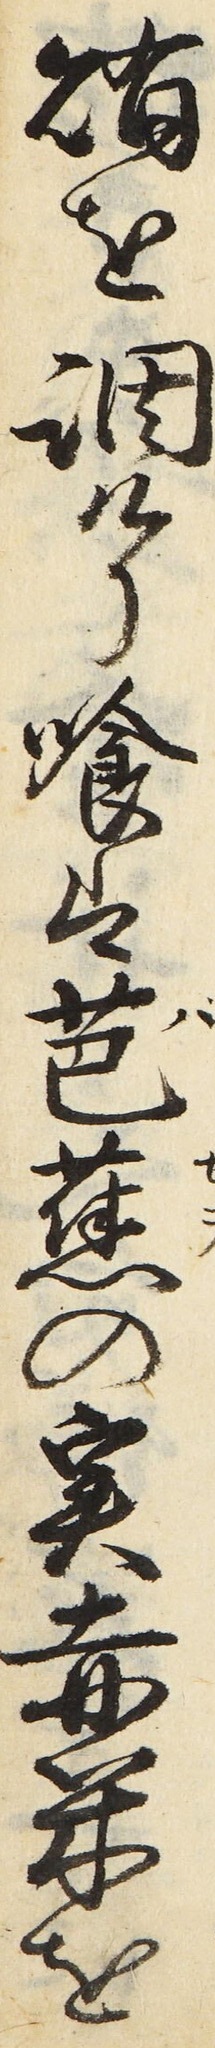賄を調けり喰は芭蕉の実赤米を

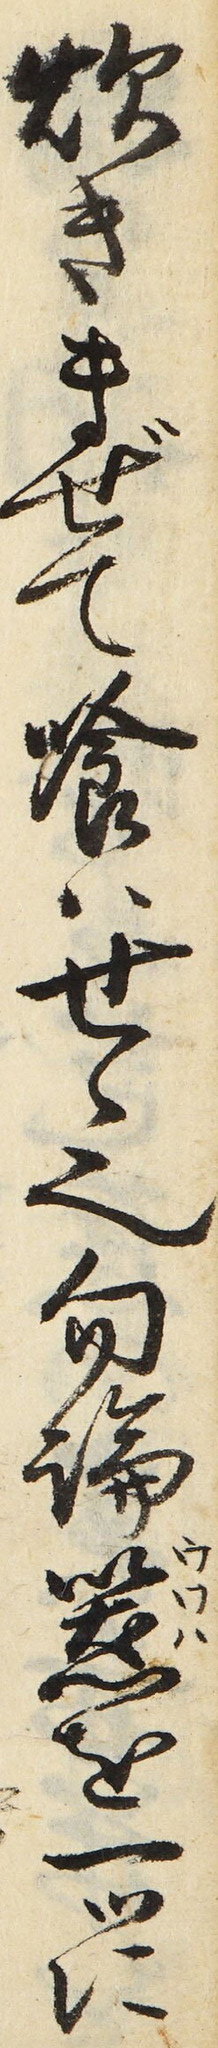炊きまぜて喰はせゝ也勿論器を一ツに
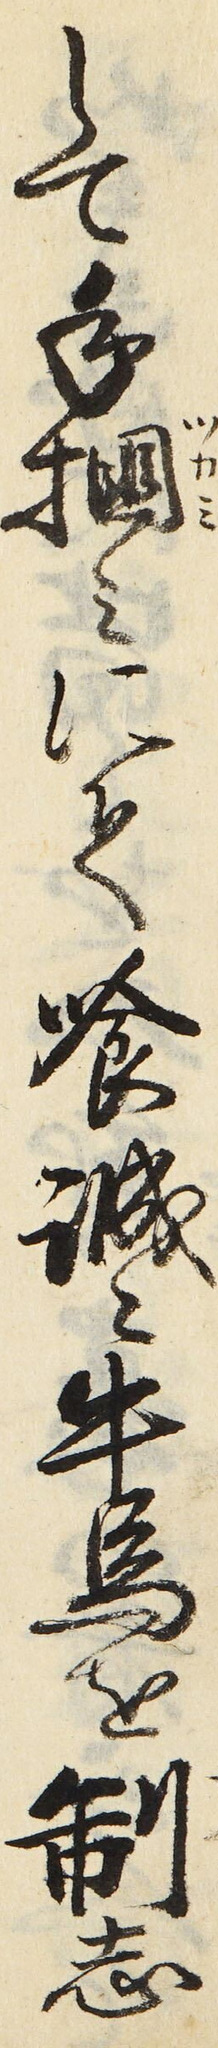して手掴みにて喰誠に牛馬を制し
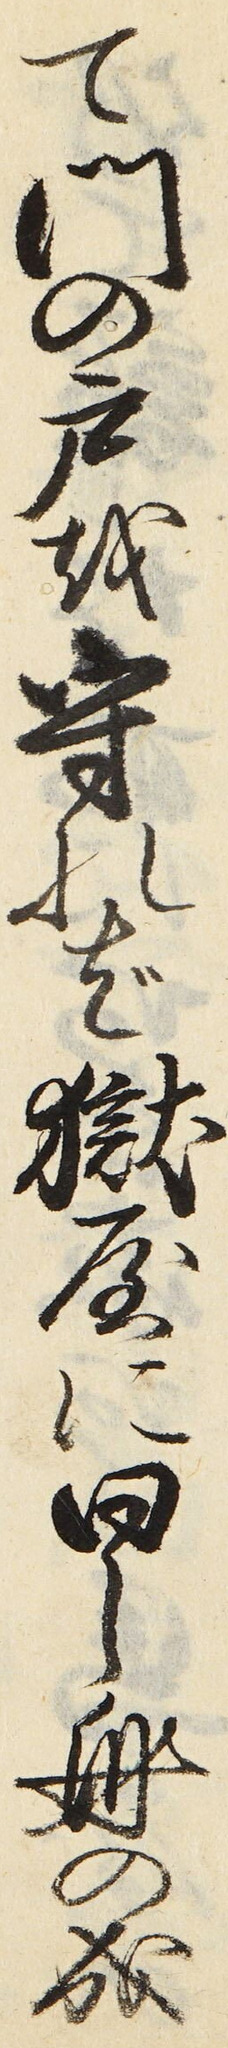て門の戸を守れば獄屋に同し身の成
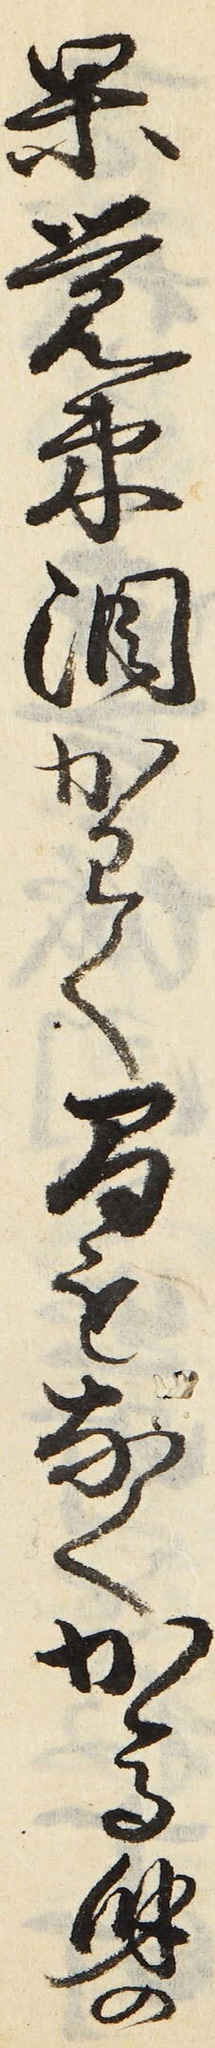果覚束泪かわく間もなくかゝる身の
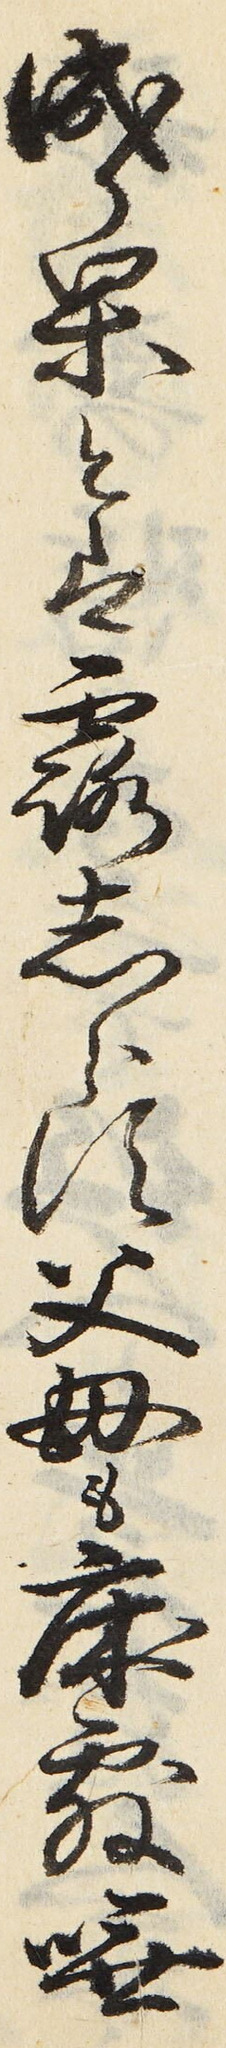成り果とは露しらす父母も床敷嘸
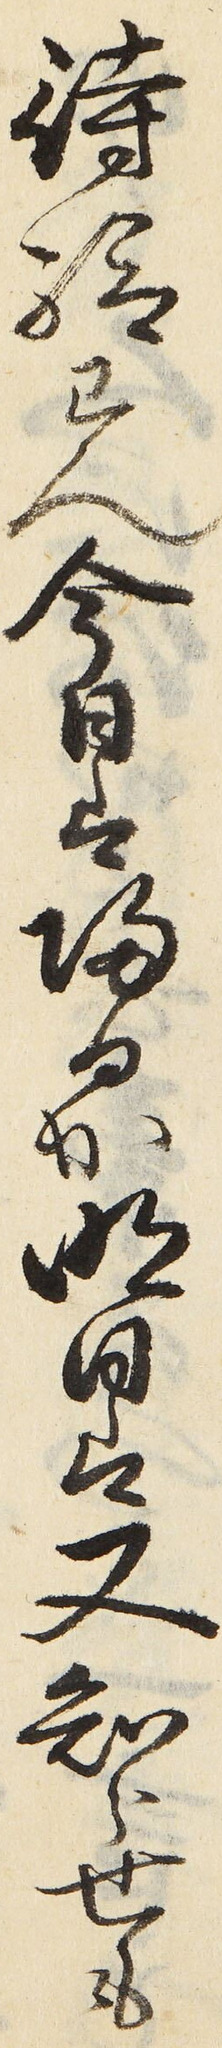待給わん今日は帰るか明日は又知らせも
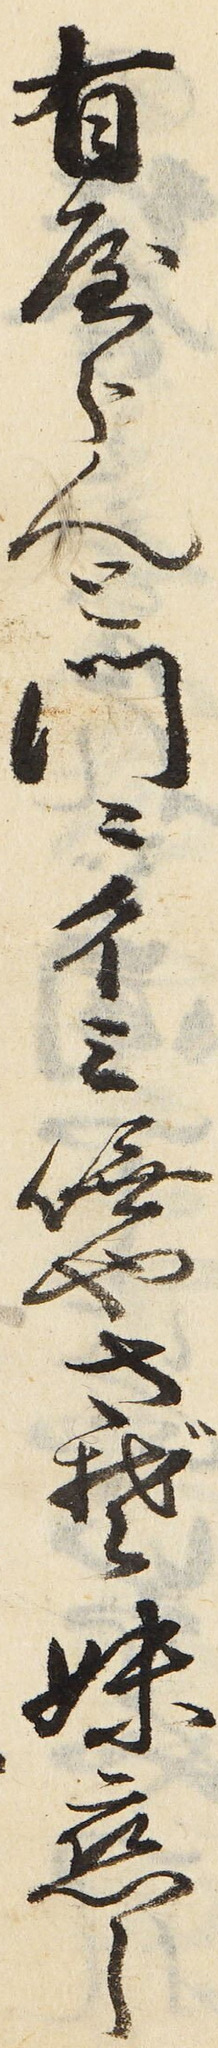有やらんと門に彳み嘸やさぞ妹恋し
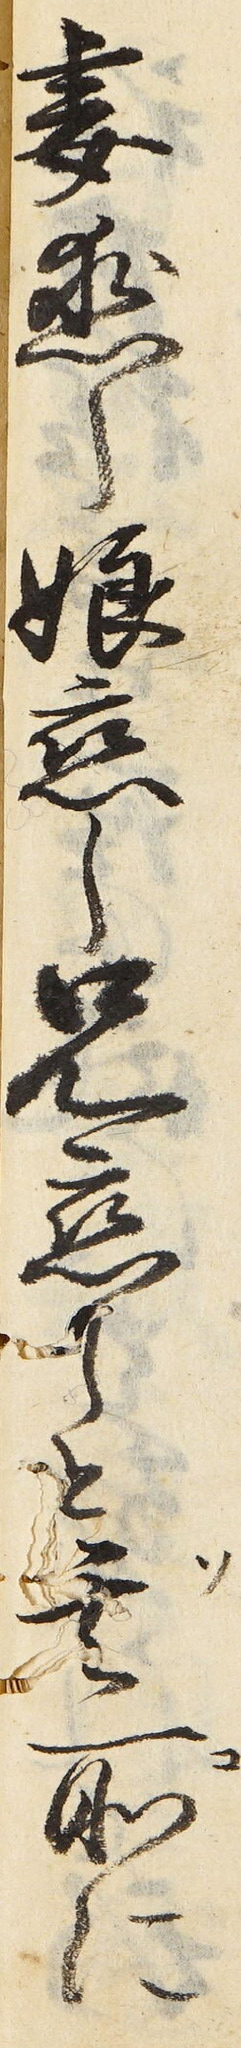妻恋し娘恋し兄恋しと其所に
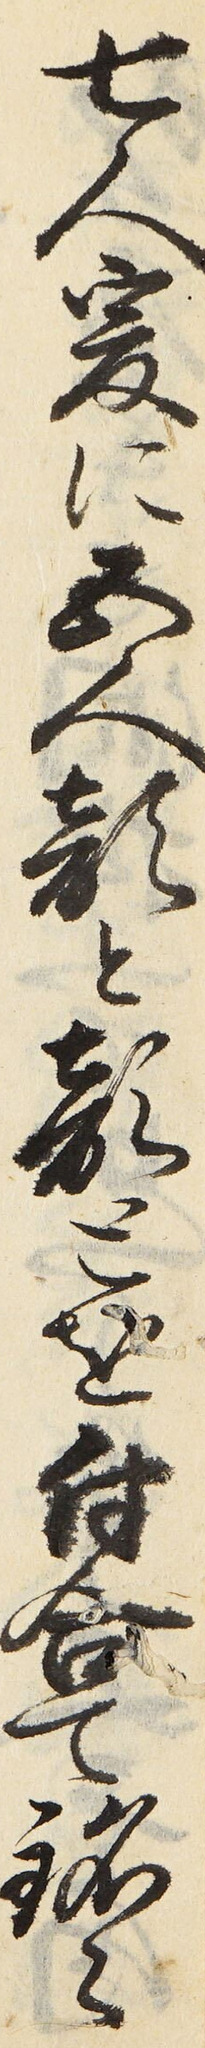七人爰に五人顔と顔とを付合て銘ゝ
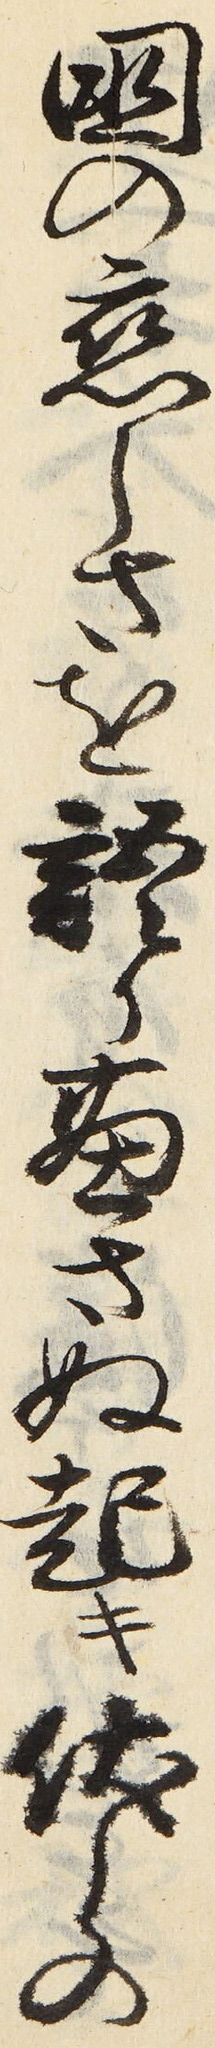国の恋しさを語り尽さぬ起き伏しの
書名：華夷九年録
